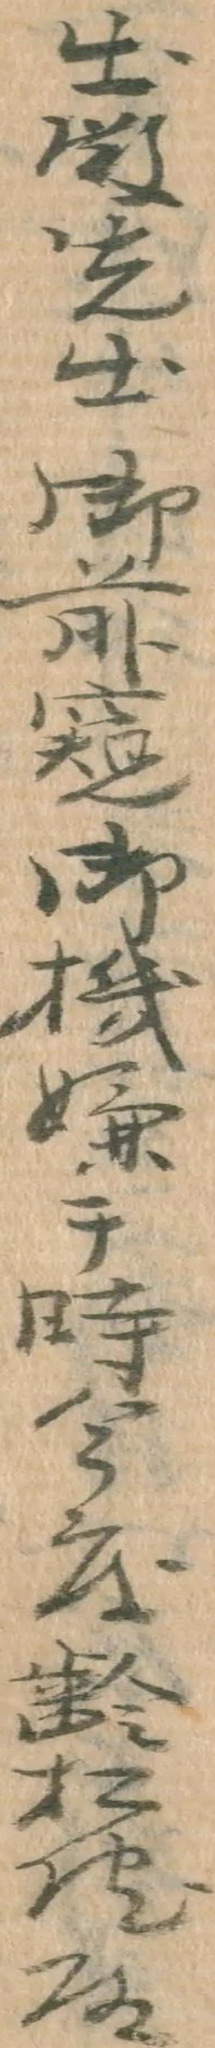出殿先出御前窺御機嫌、于時今度齢松院殿
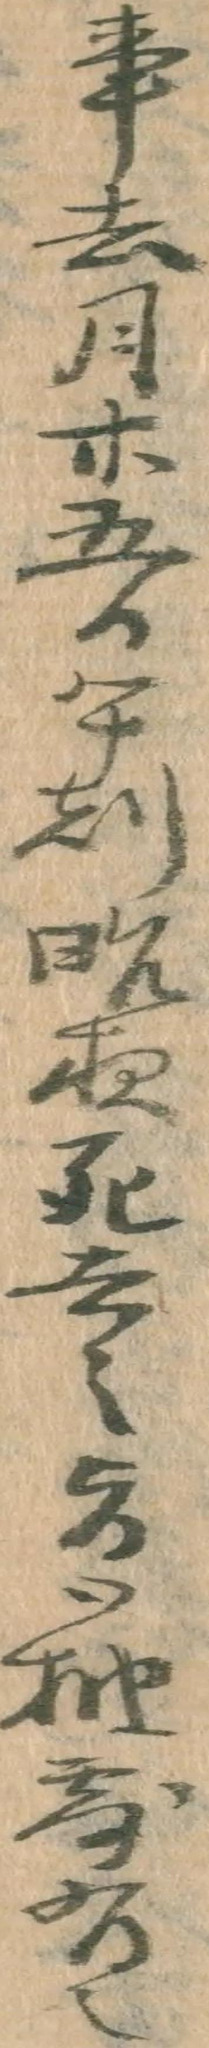事、去月廿五日午刻昨夜死去之旨御披露有之、
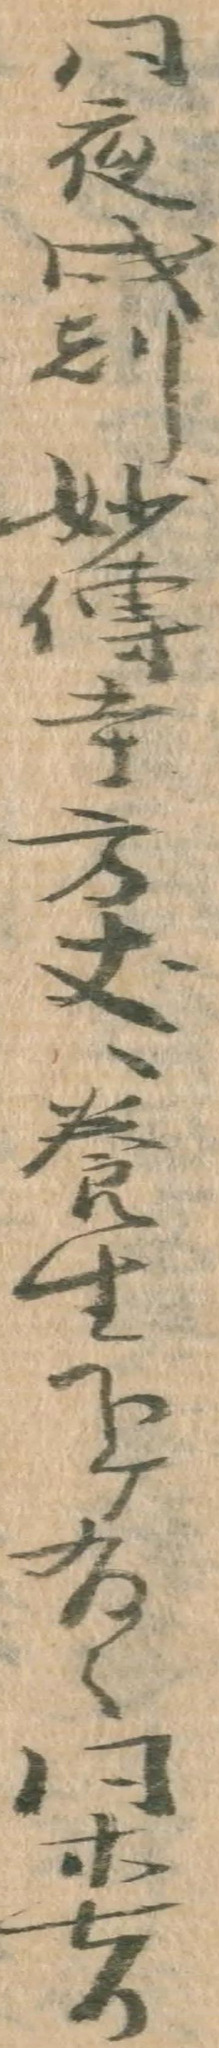同夜戌刻妙傳寺方丈へ養生下ケ有之、同廿七日
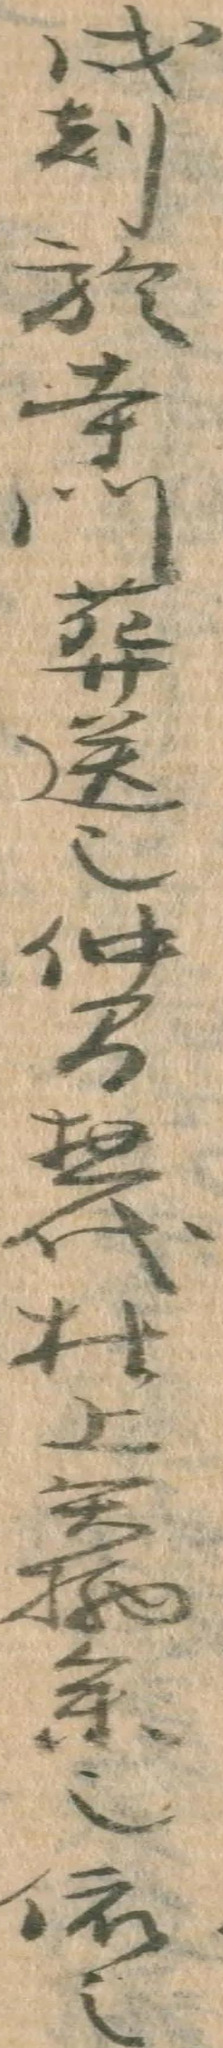戌刻、於寺門葬送也、仲間惣代村上実柄参也、依之
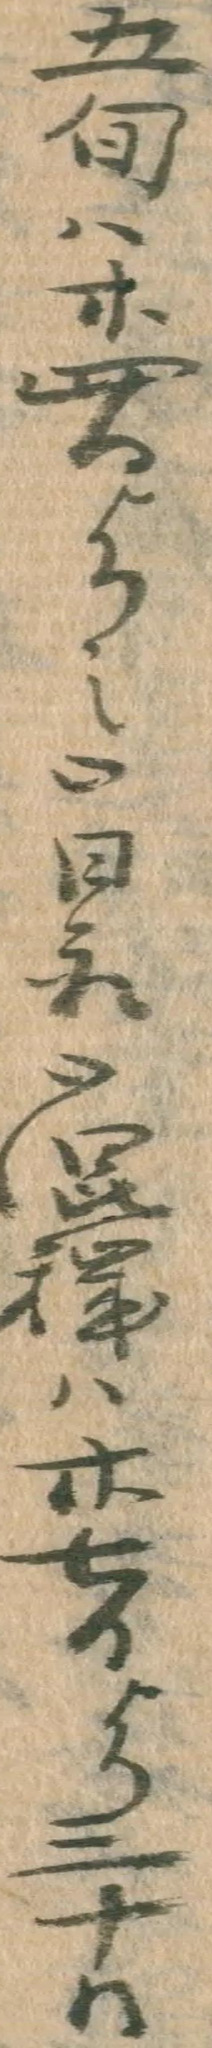五旬ハ廿四日より之御日取御混穢ハ廿七日よリ三十日
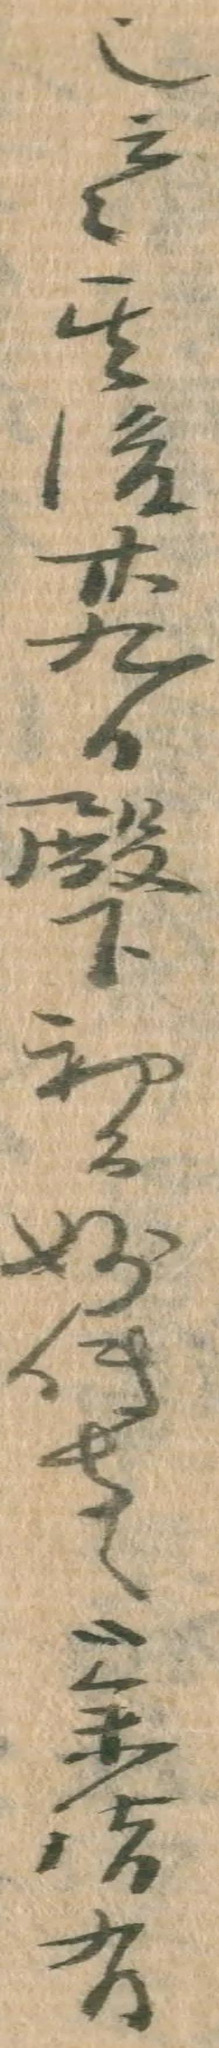也云々、其後廿九日殿下初而妙傳寺へ御参詣有
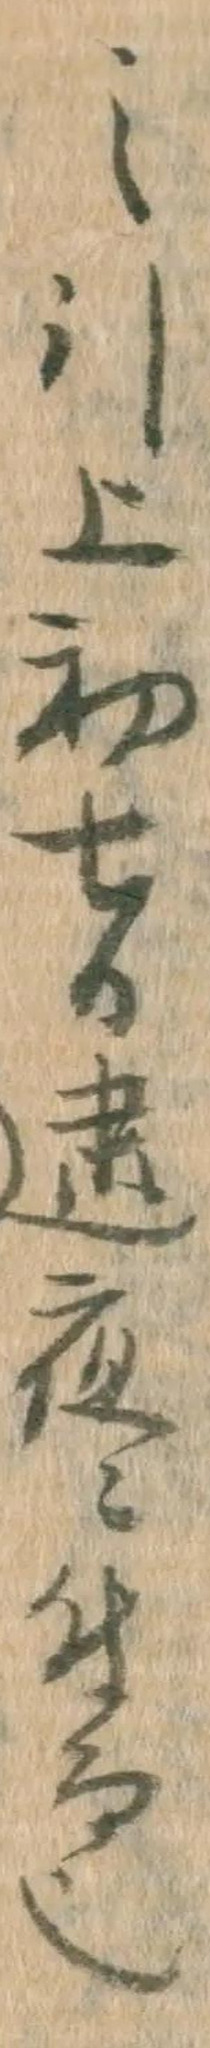之、引上初七日夜ニ付而也、
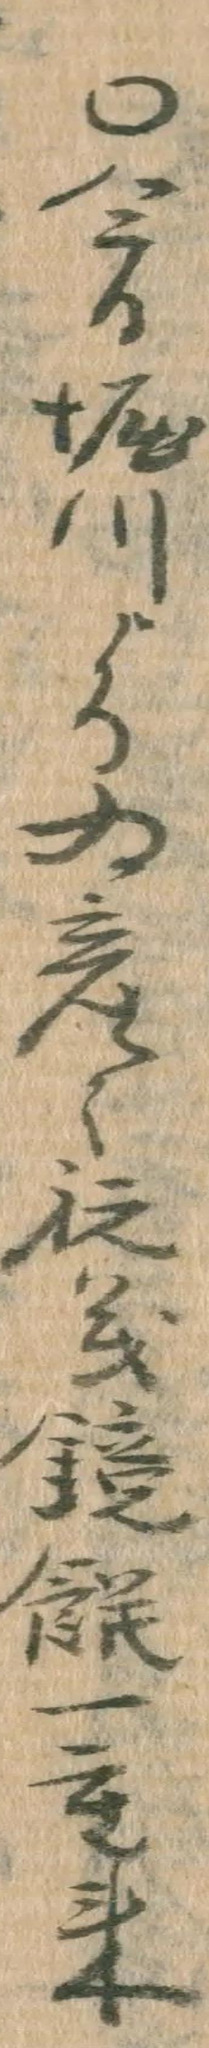○今日堀川より為産之祝義鏡餅一重来、
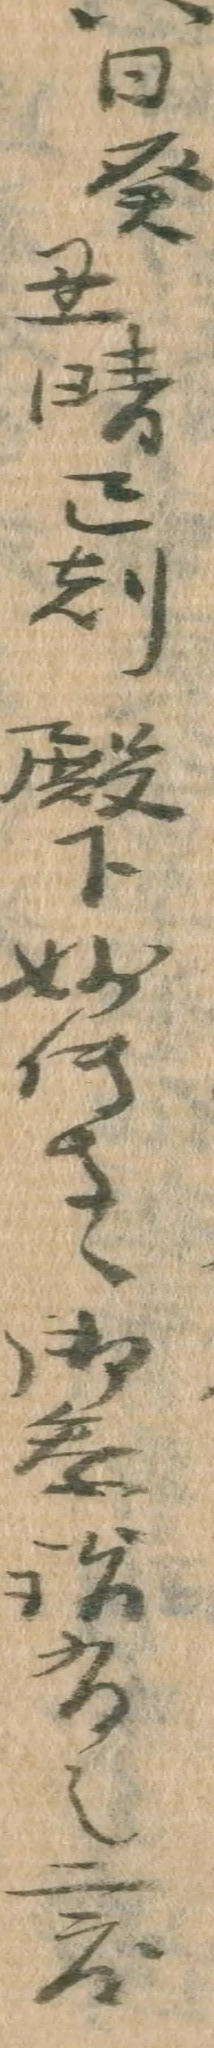六日癸丑晴、巳刻殿下妙傳寺へ御参詣有之、二度
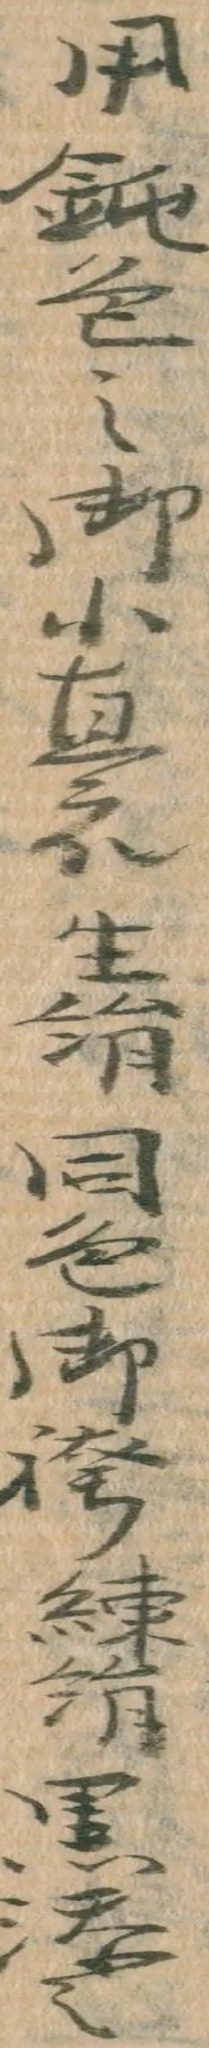用鈍色之御小直衣生絹、同色御袴練絹黒添也、
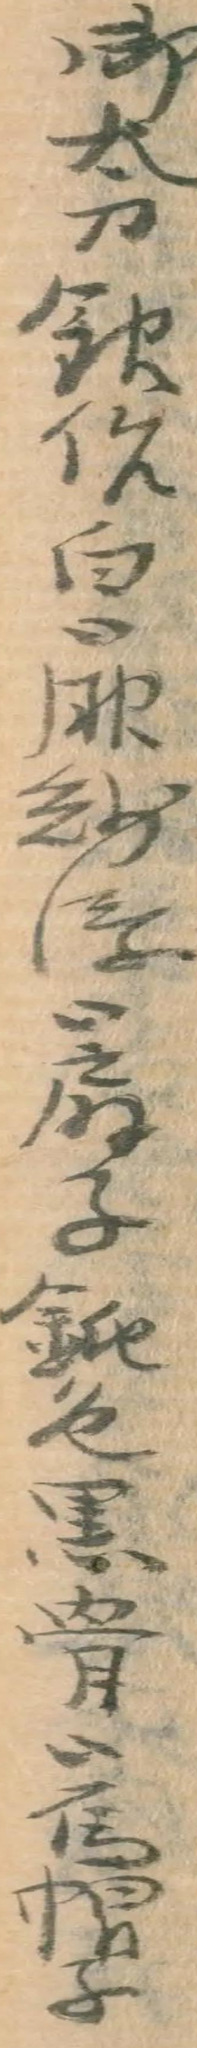御太刀銀作、白御服紗添、御扇子鈍色黒骨、烏帽子
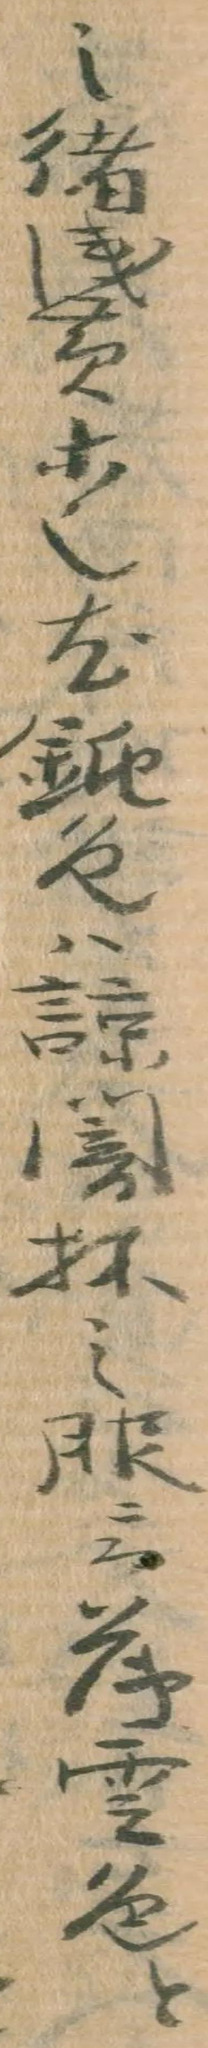之緒浅黄等也、尤鈍色ハ諒闇之服ニ而、落雲色と
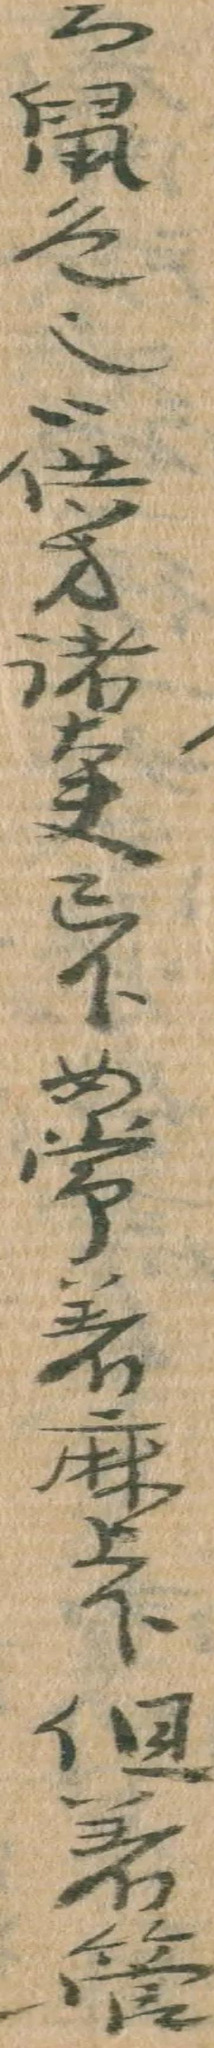而鼠色也、御供方、諸大夫已下如常着麻上下、但着管
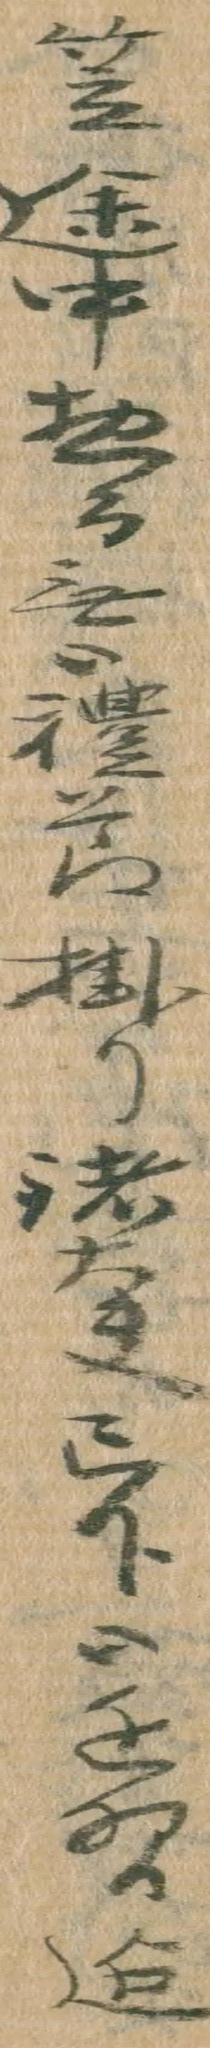笠、途中惣而無御禮節掛り、諸大夫已下御近習迄
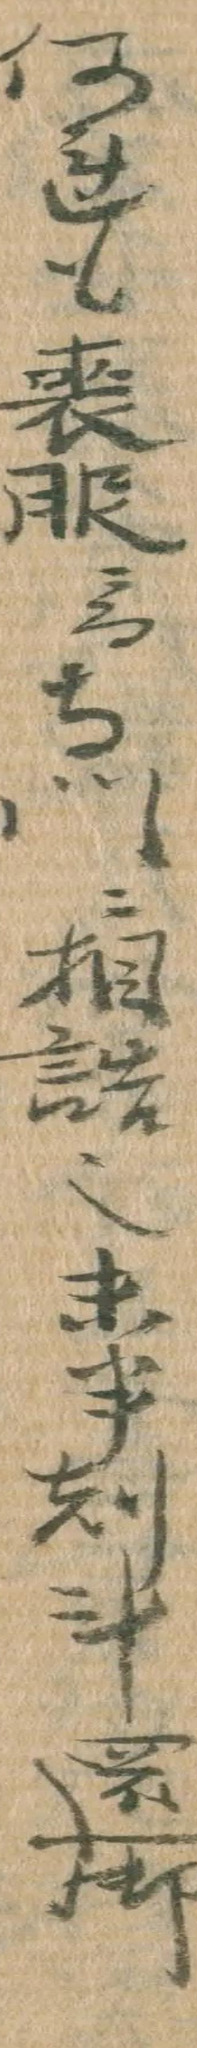何れも喪服ニ而門に相詰也、未半刻斗還御、
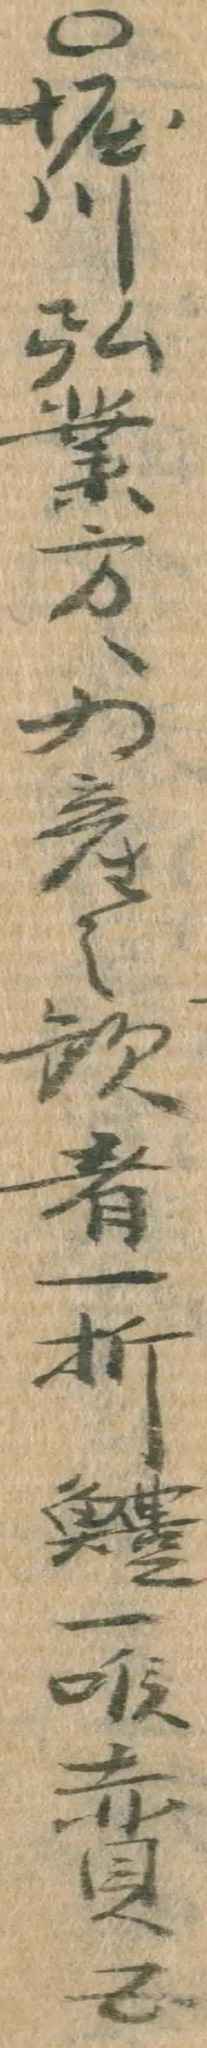○堀川弘業方へ為産之歓肴一折・鱧一喉・赤貝五
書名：賀茂社記録. 第63冊
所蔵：国立国会図書館 National Diet Library, JAPAN
